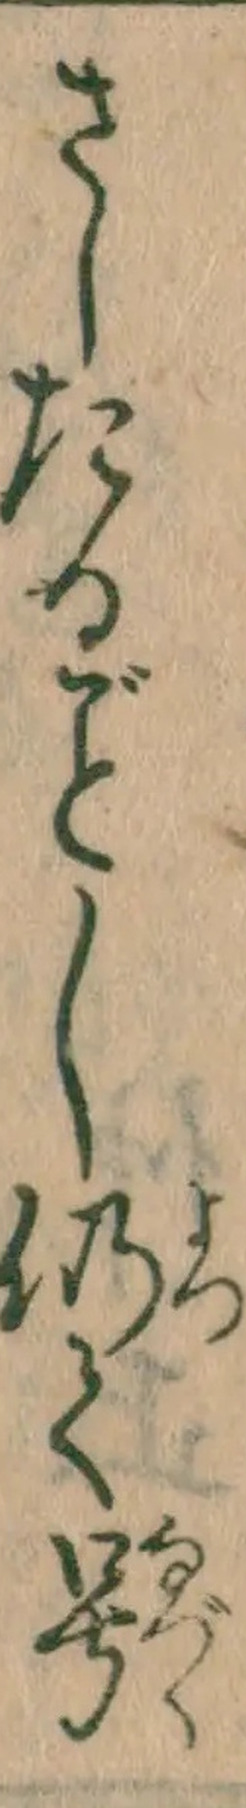さしたるごとし仍て号

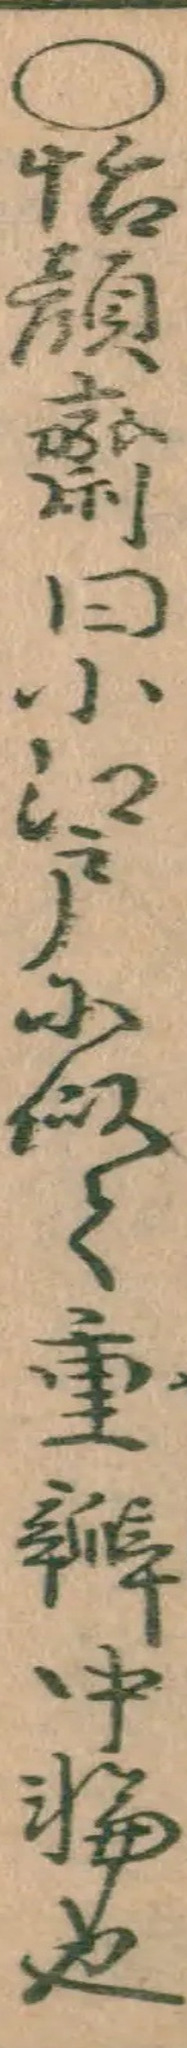○怡顔斎曰小江戸に似て重弁中輪也
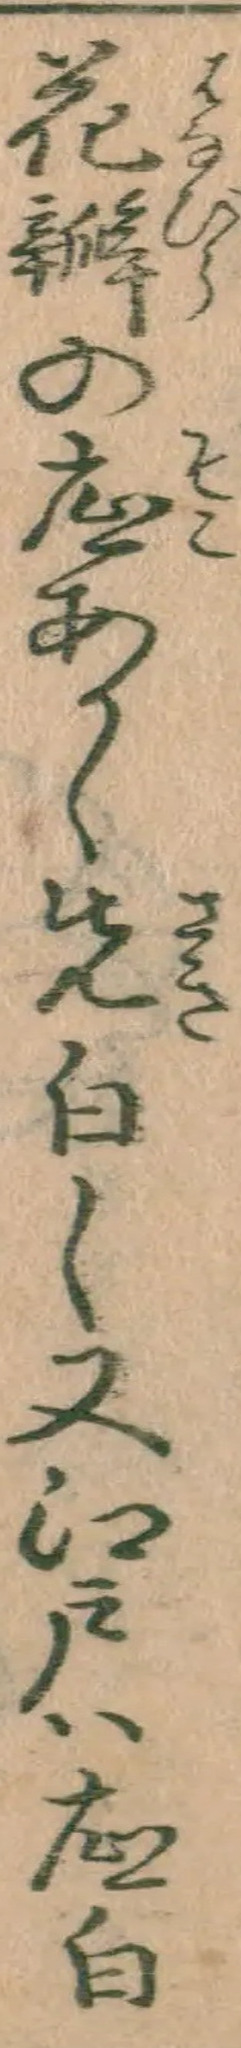花弁の底あかし先白し又江戸は底白
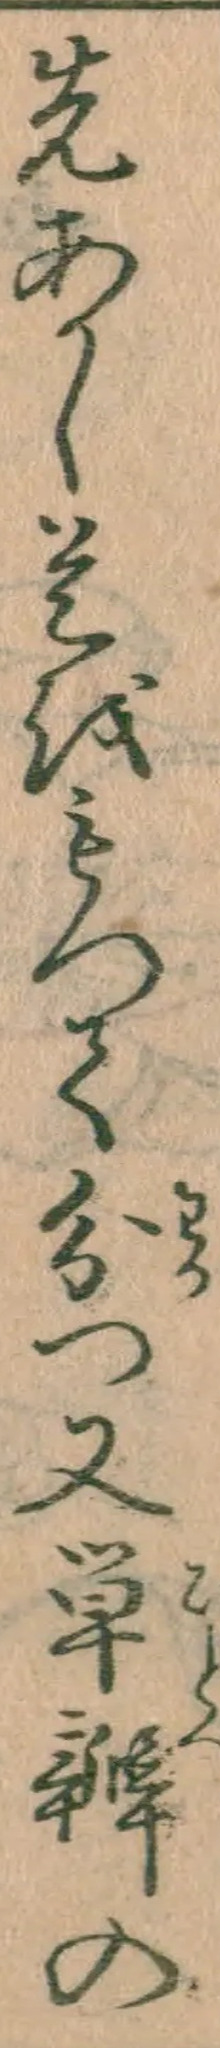先あかし是をもつて分つ又単弁の
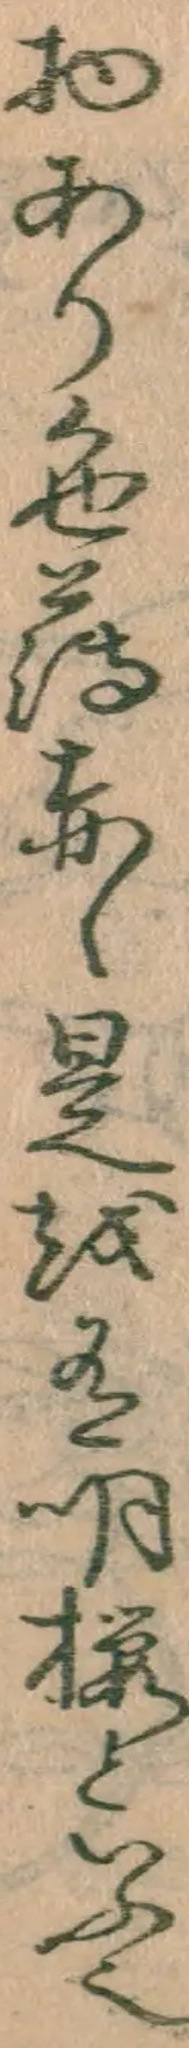物あり色薄赤し是を有明桜といふ也
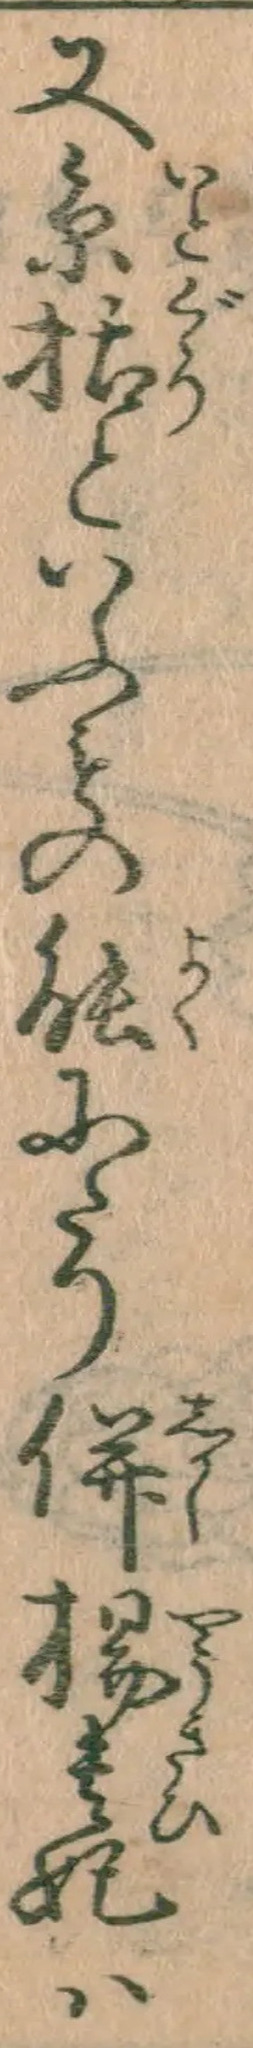又糸括といふもの能にたり併楊貴妃は
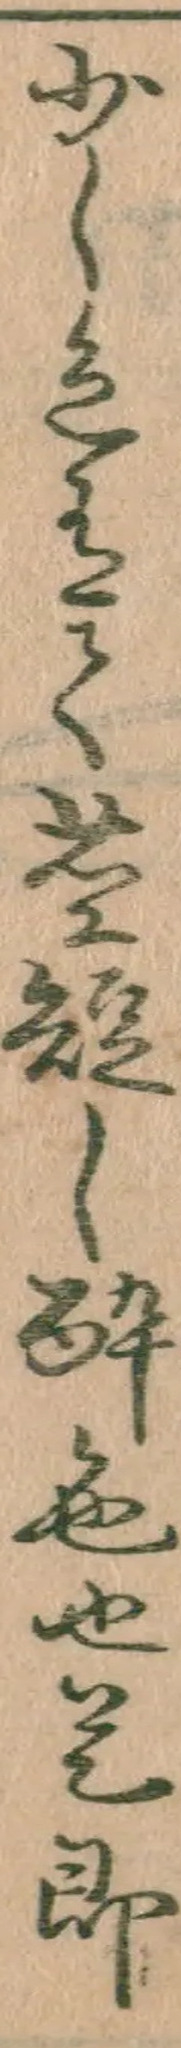少し色有て茎短し酔色也是即
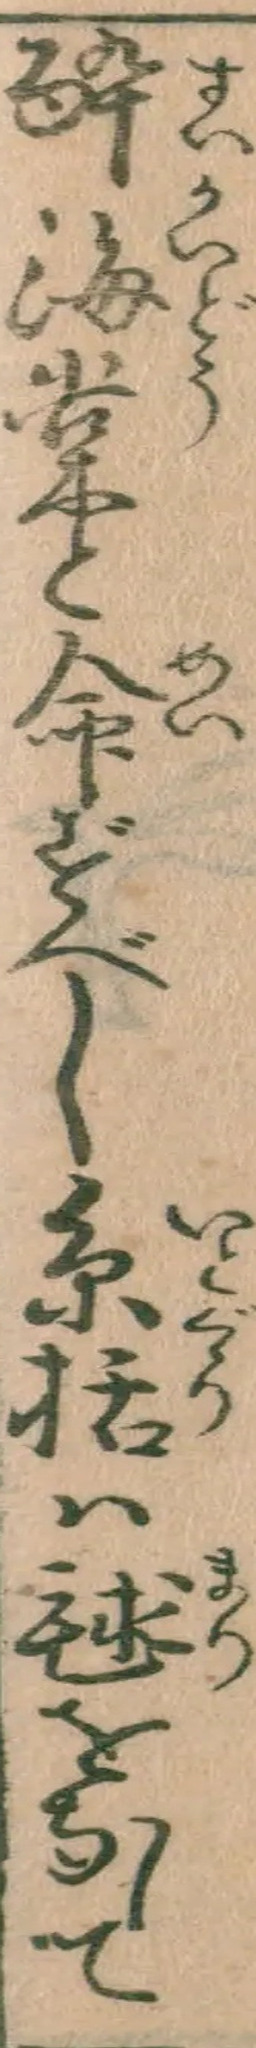酔海棠と命ずべし糸括は毬をなして
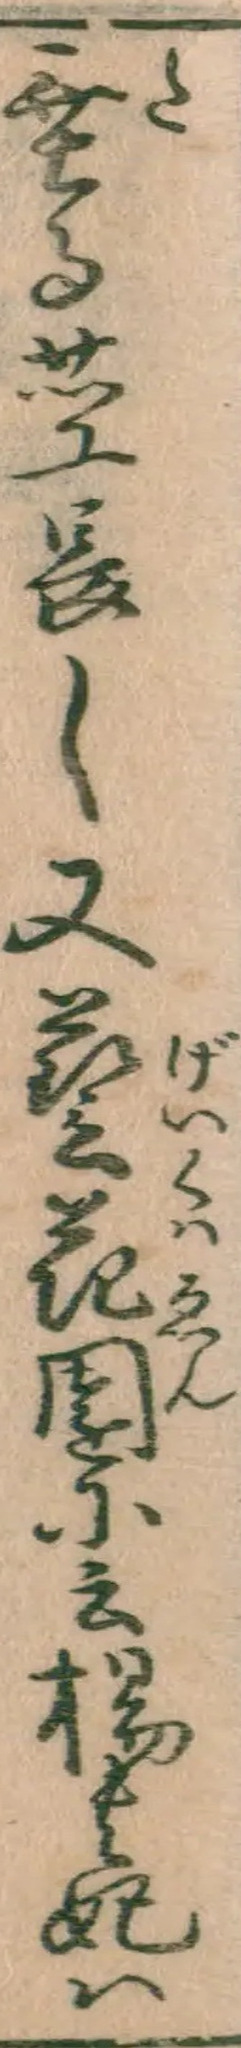垂る茎長し又芸花園に云楊貴妃は
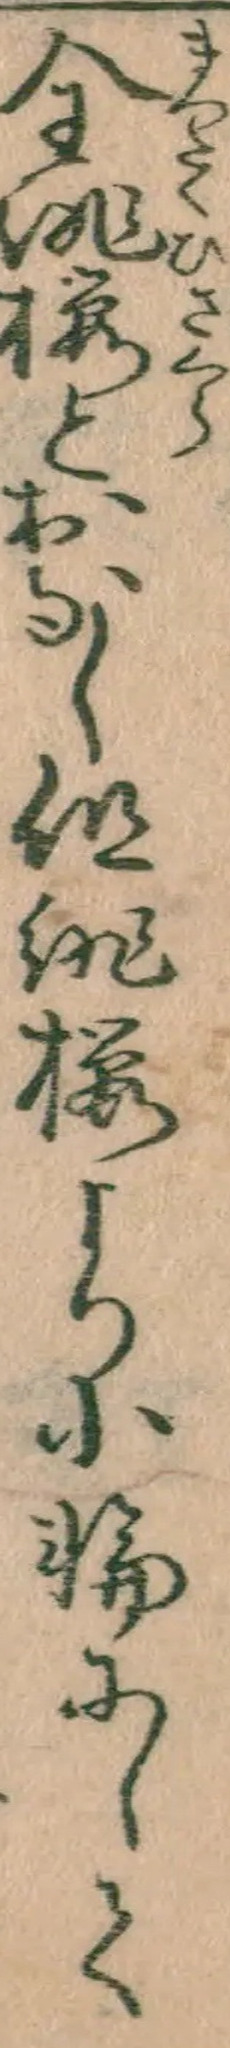全緋桜とおなし但緋桜より小輪にして
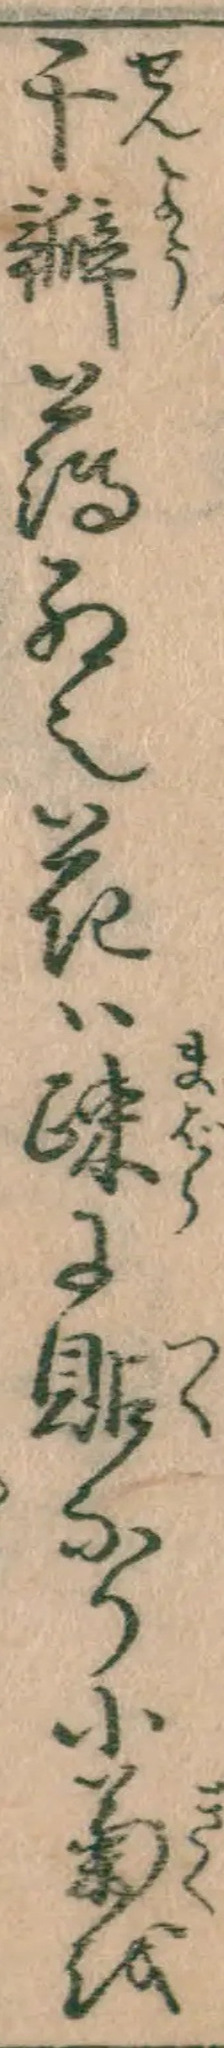千弁薄紅也花は疎に貼なり小菊を
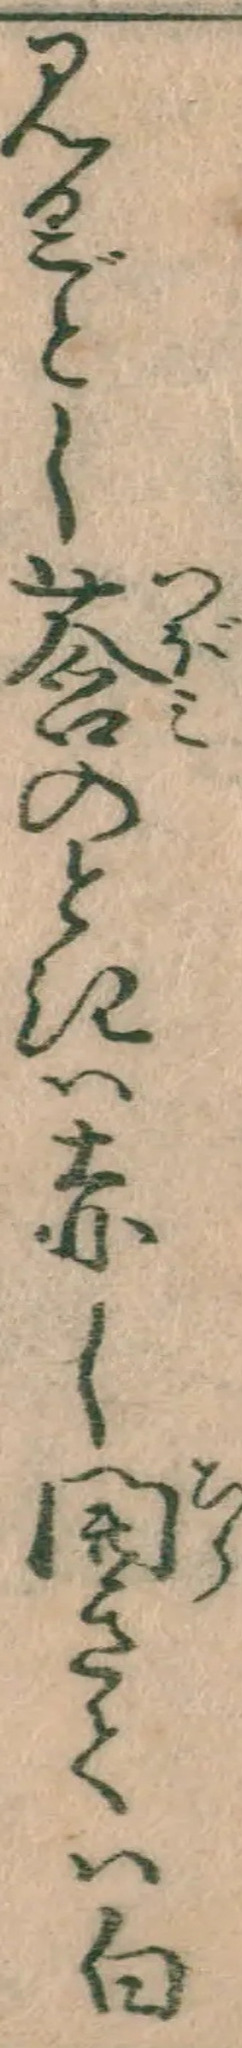見るごとし莟のときは赤し開きては白
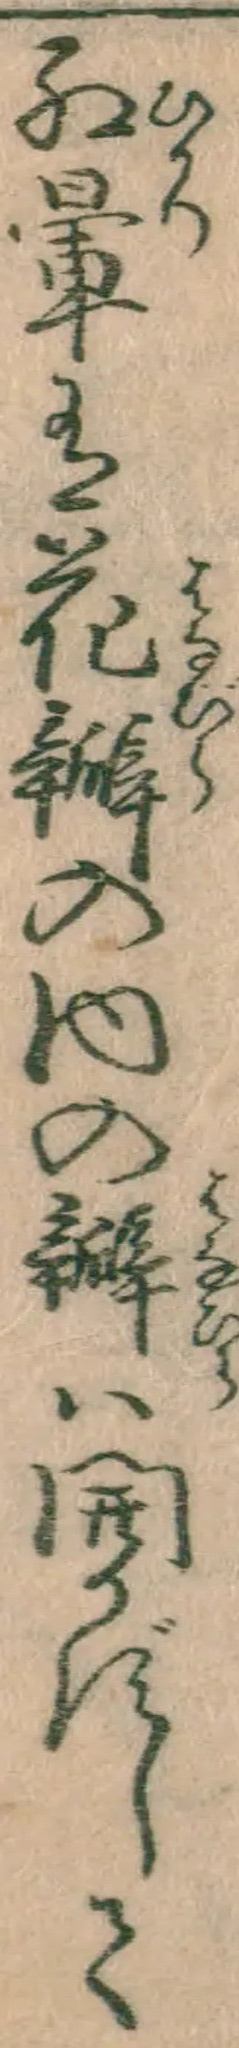紅暈有花弁の内の弁は開かずして
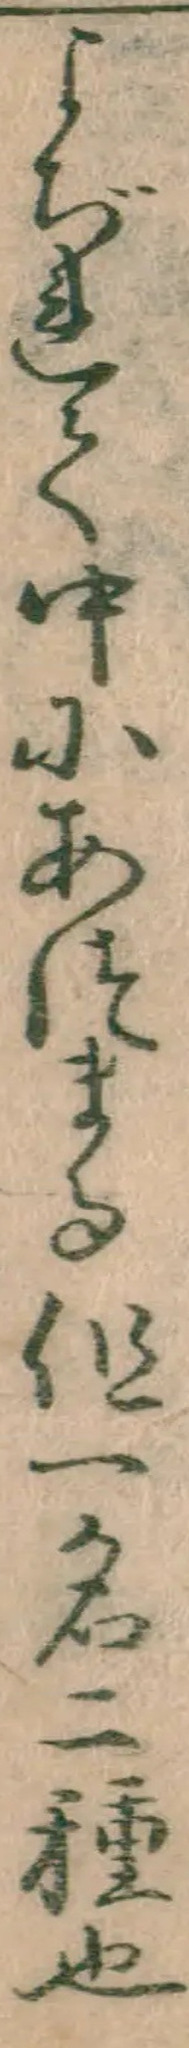よぢれて中にあつまる但一名二種也
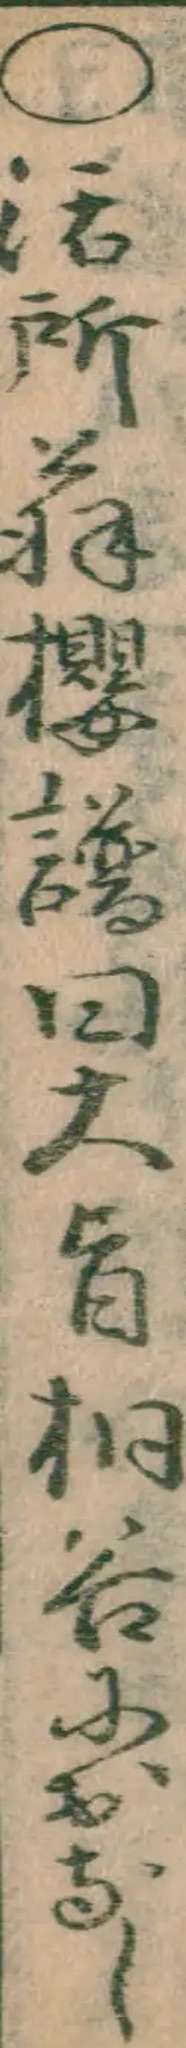○活所翁桜譜曰大旨桐谷におなし

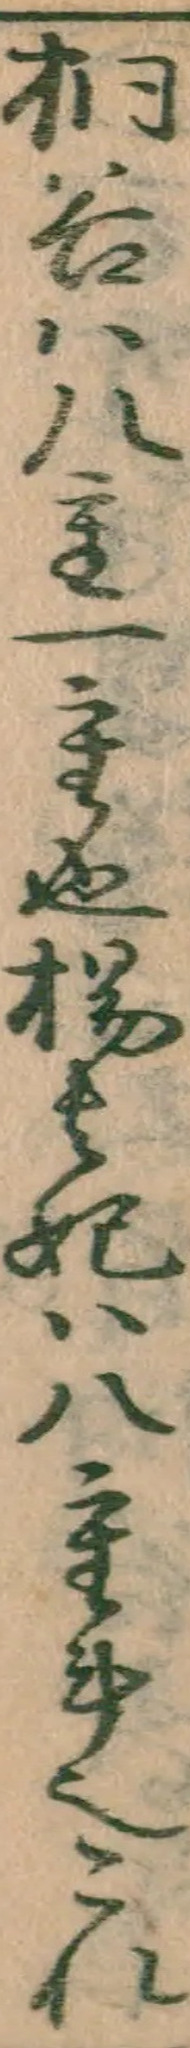桐谷は八重一重也楊貴妃は八重斗也これ
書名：怡顔齋櫻品
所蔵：国立国会図書館 National Diet Library, JAPAN
